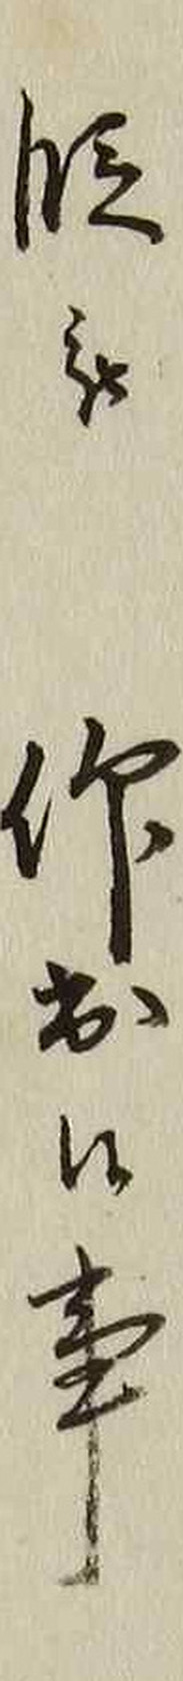段被仰出候事
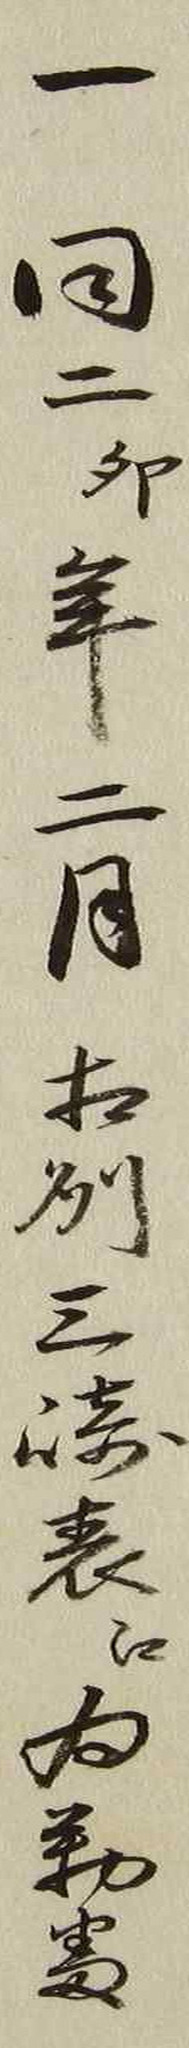一同二卯年二月相州三崎表江為勤番
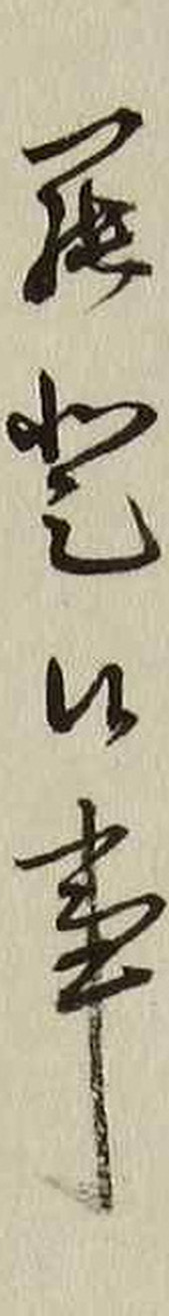罷登候事
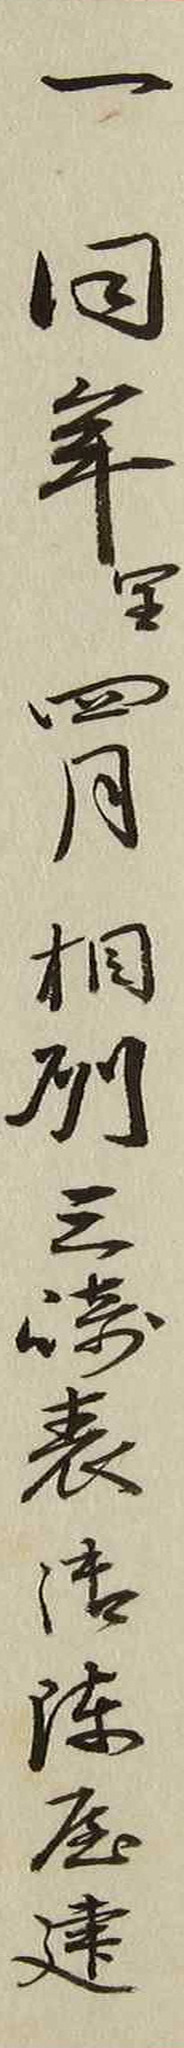一同年閏四月相州三崎表御陳屋建
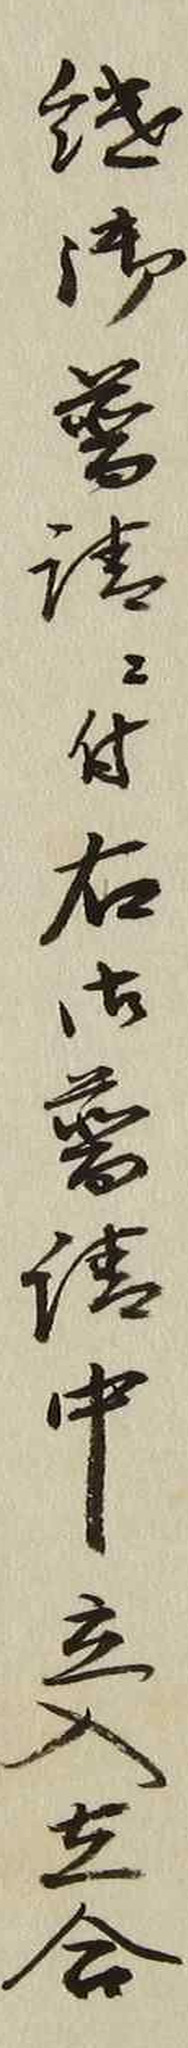継御普請ニ付右御普請中立入立合
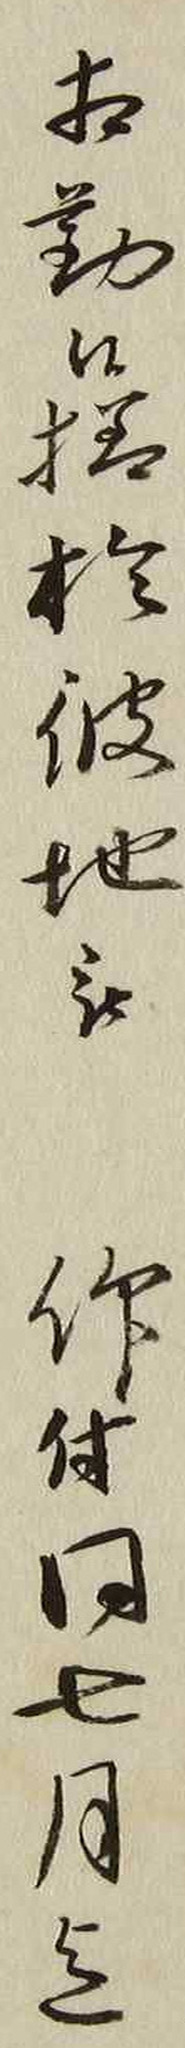相勤候様於彼地被仰付同七月迄
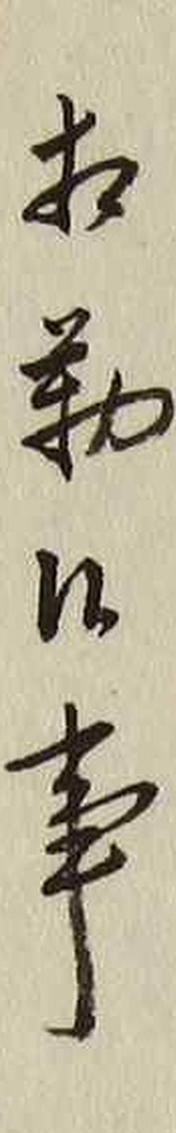相勤候事
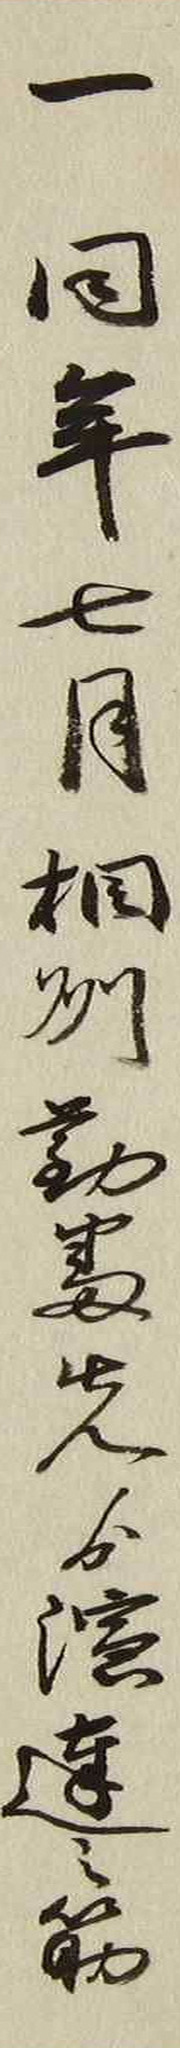一同年七月相州勤番先ゟ演達之筋
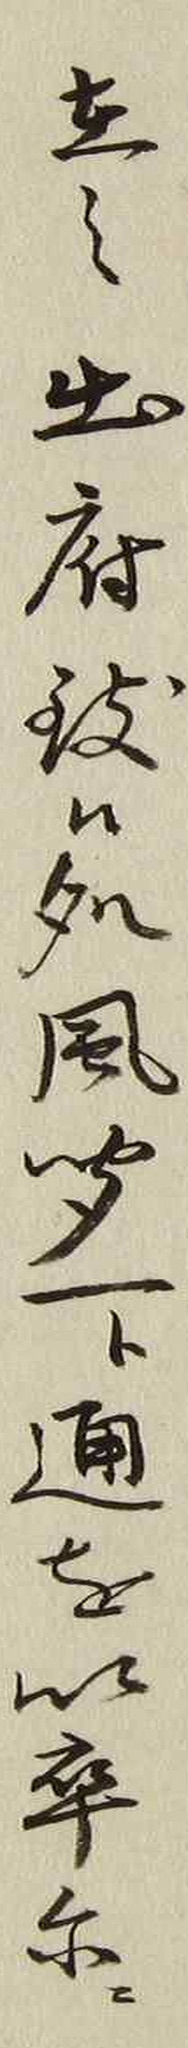在之出府致候処風聞一ト通を以卒爾ニ
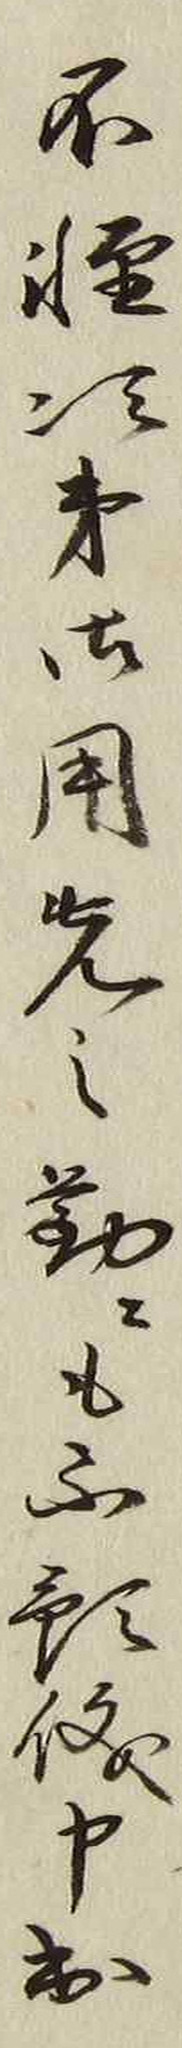不軽次第御用先之勤ニも不預儀申出
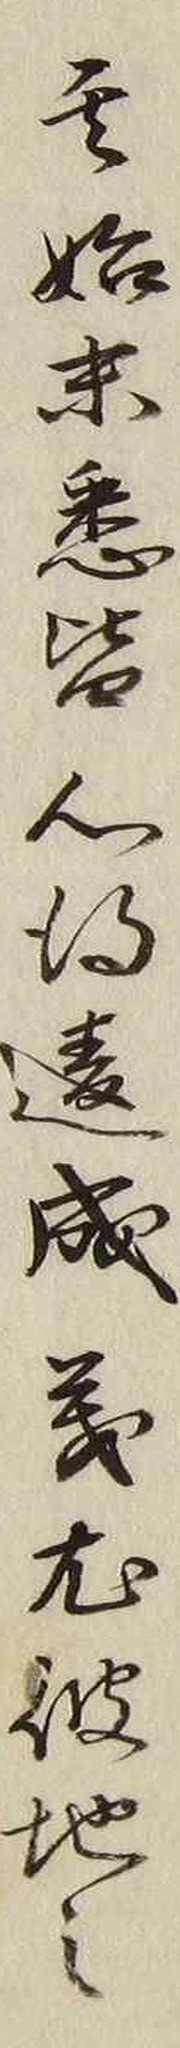其始末悉皆心得違成義尤彼地之
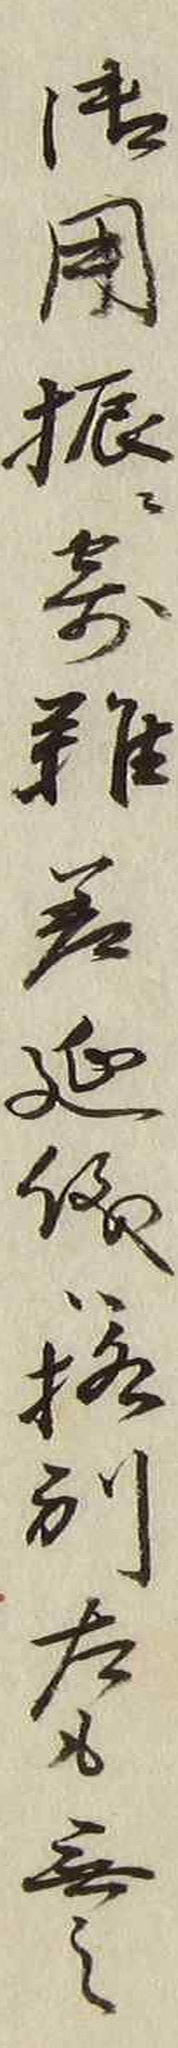御用振ニ寄難差延儀ハ格別左も無之

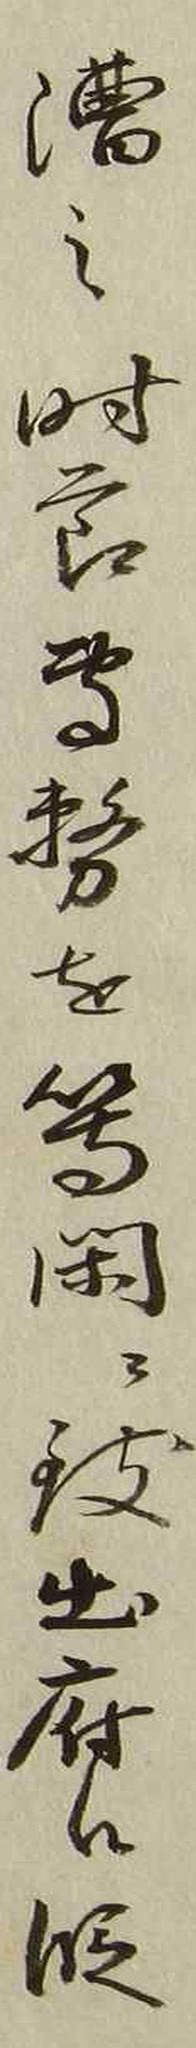漕之時節専務を等閑ニ致出府候段
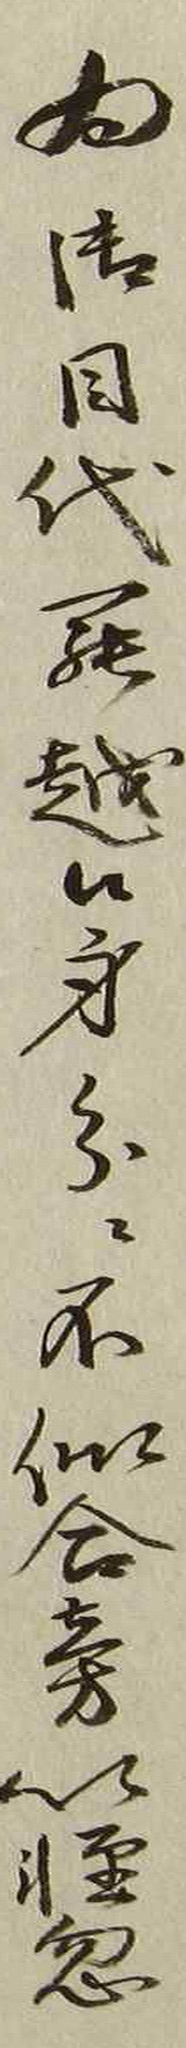為御目代罷越候身分ニ不似合旁以軽忽
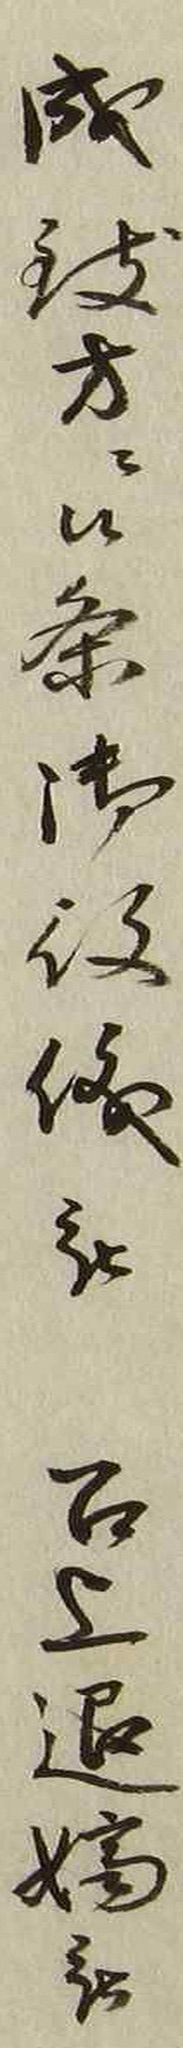成致方ニ候条御役儀被召上退嫡被
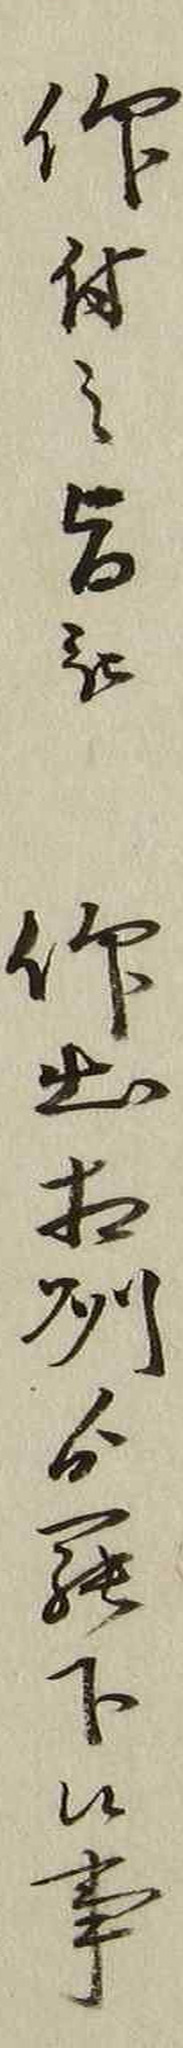仰付之旨被仰出相州ゟ罷下候事
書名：諸士系譜　巻之149　そ之部2
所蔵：会津若松市立会津図書館
